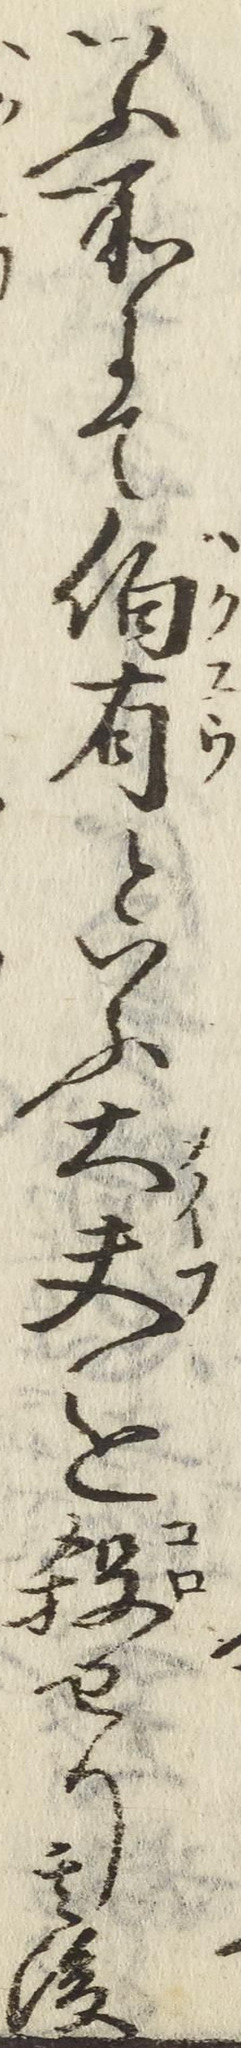いふ所にて伯有といふ大夫を殺せり其後
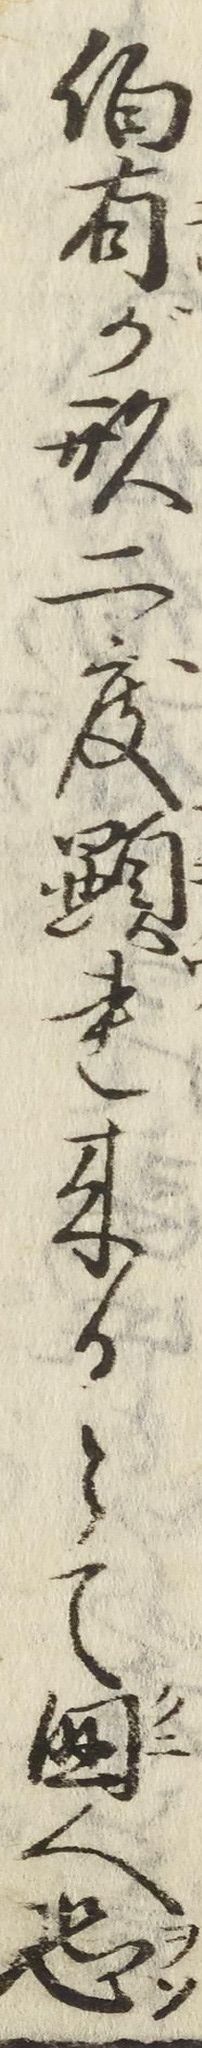伯有が形二度顕れ来るとて国人恐
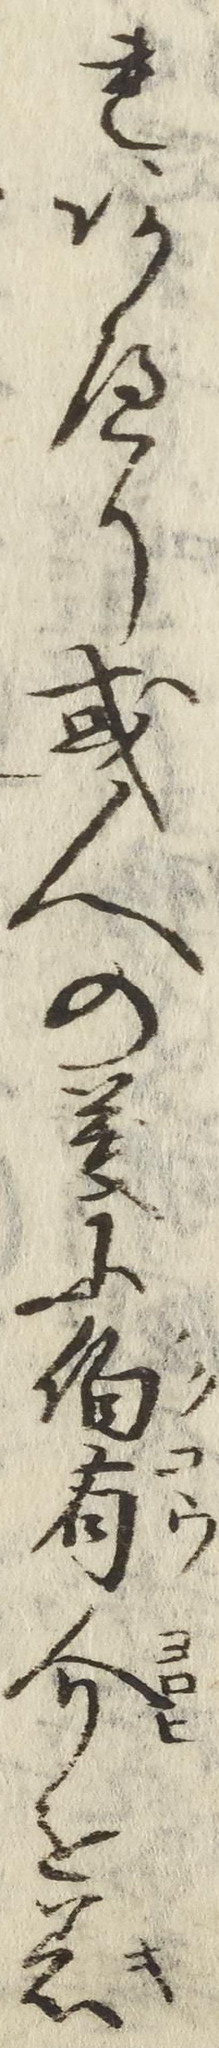れあへり或人の夢に伯有介を着
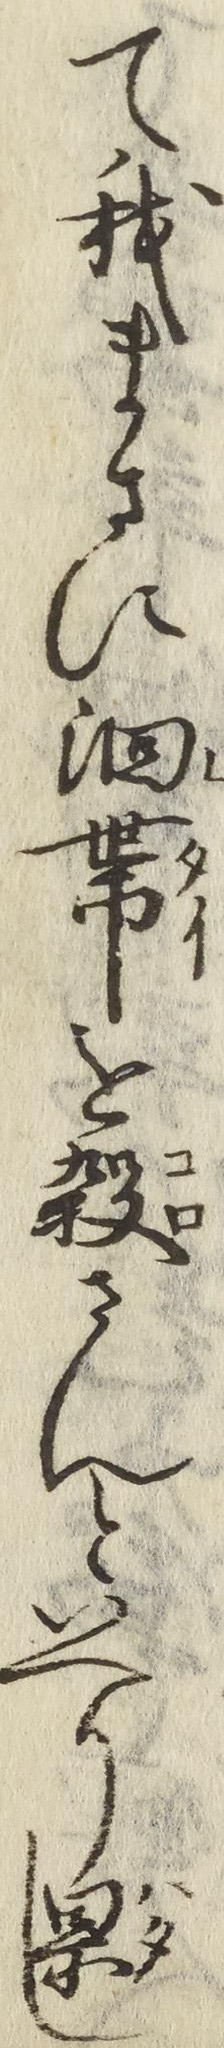て我まさに泗帯を殺さんといへり果し

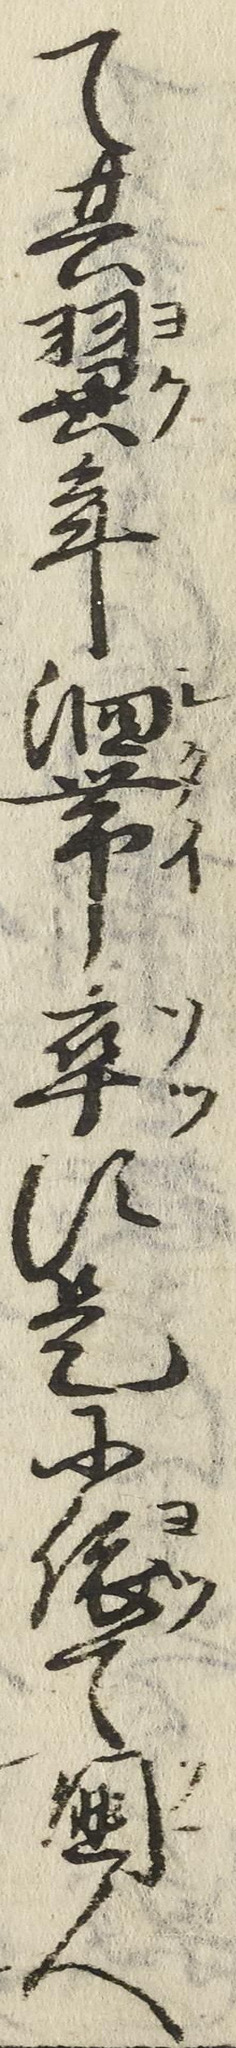て其翼年泗帯卒す是に依て国人
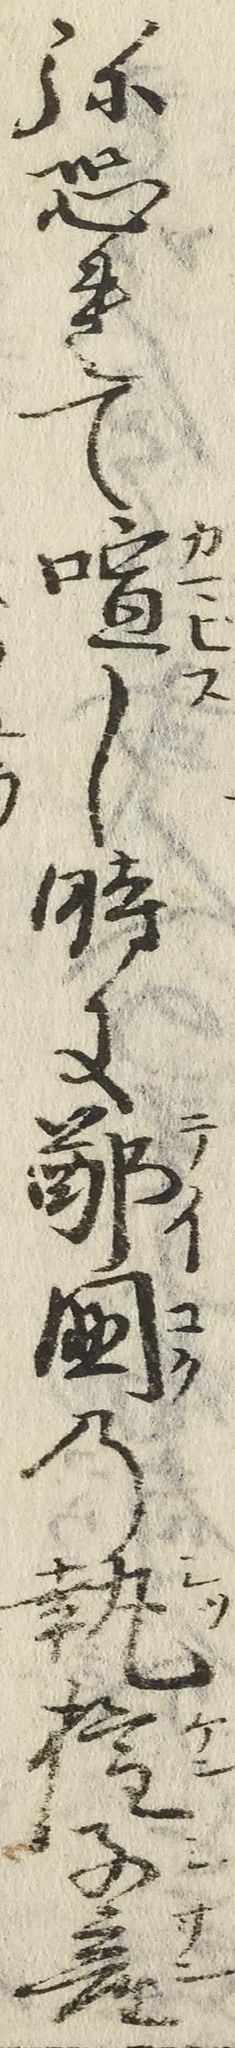弥恐れて喧し時に鄭国の執権子産
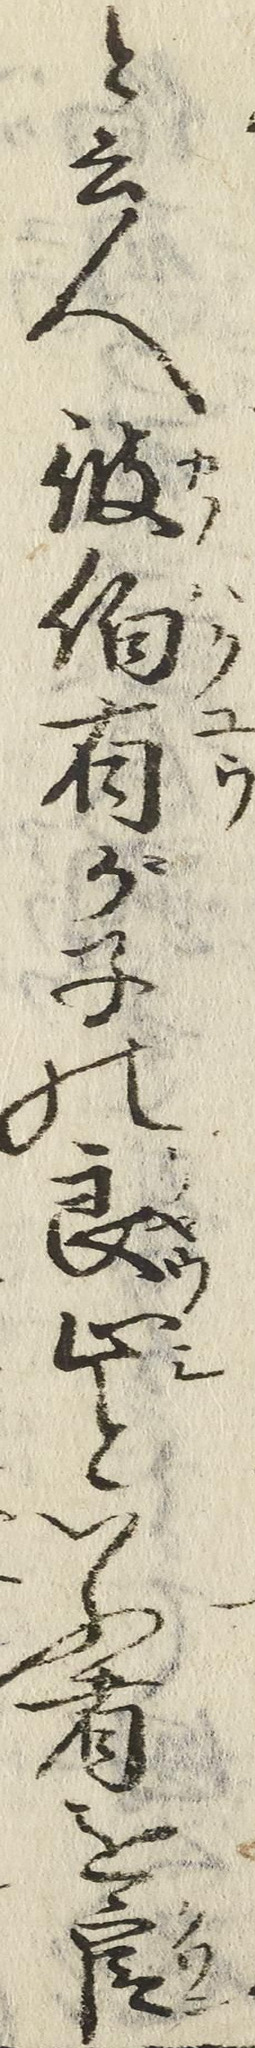と云人彼伯有が子の良止といふ者を官
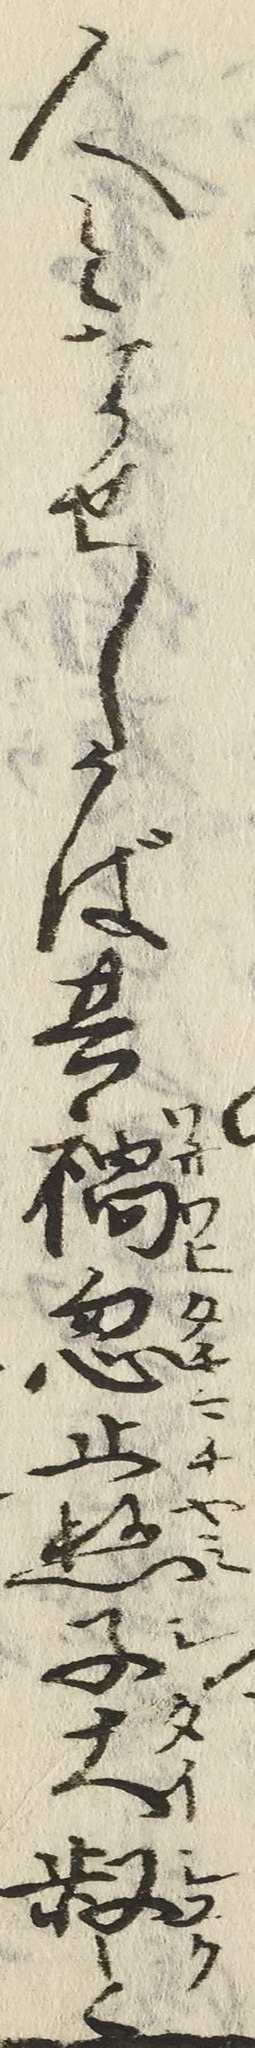人となせしかば其禍忽止ぬ子大叔と
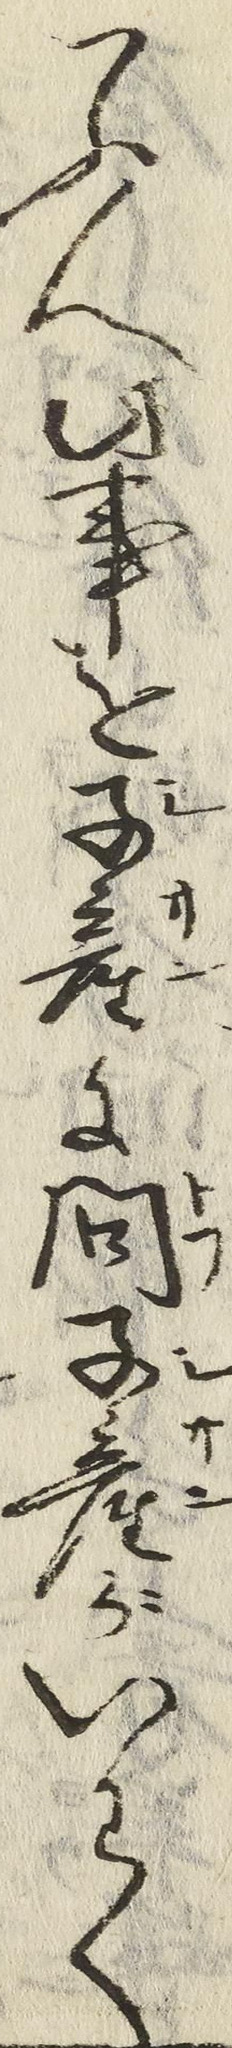いふ人此事を子産に問子産がいわく
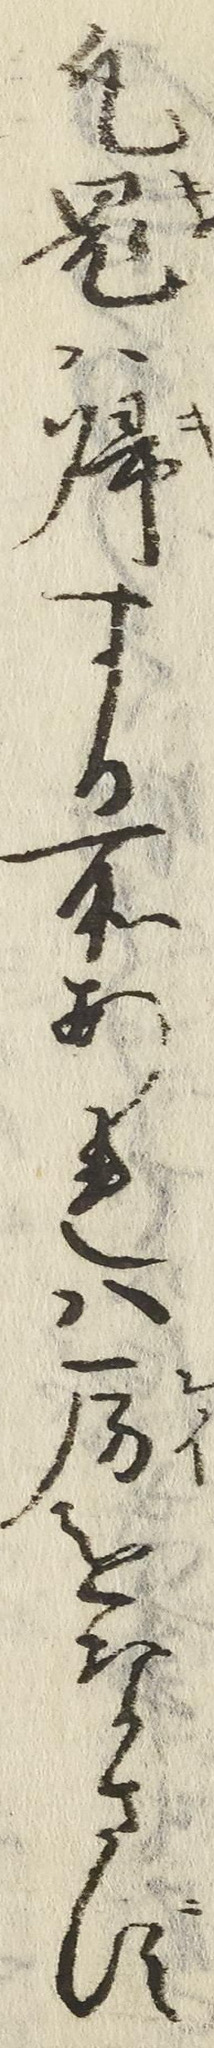凡鬼は帰する所あれは厲をなさず
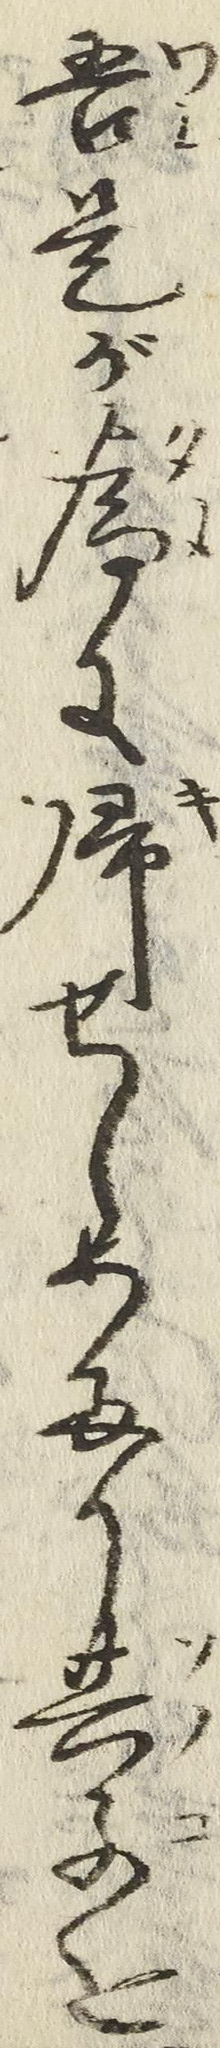吾是が為に帰せしめたり其子を
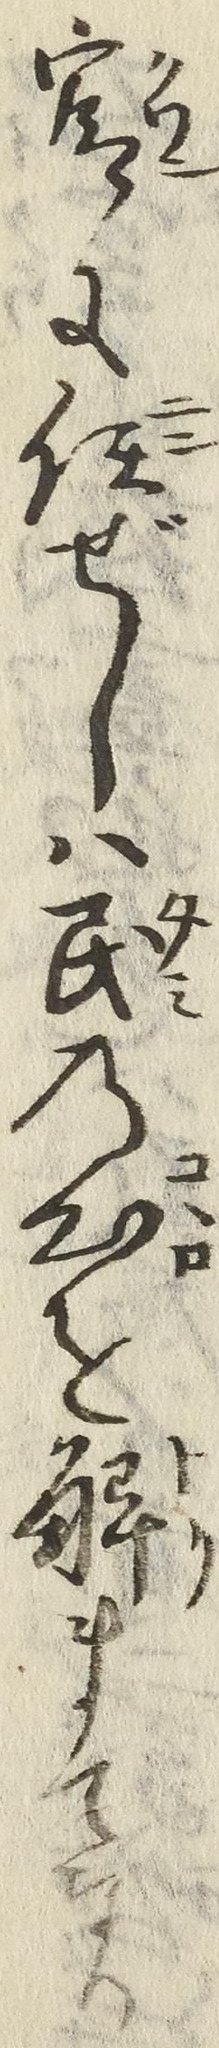官に任ぜしは民の心を解まてなり
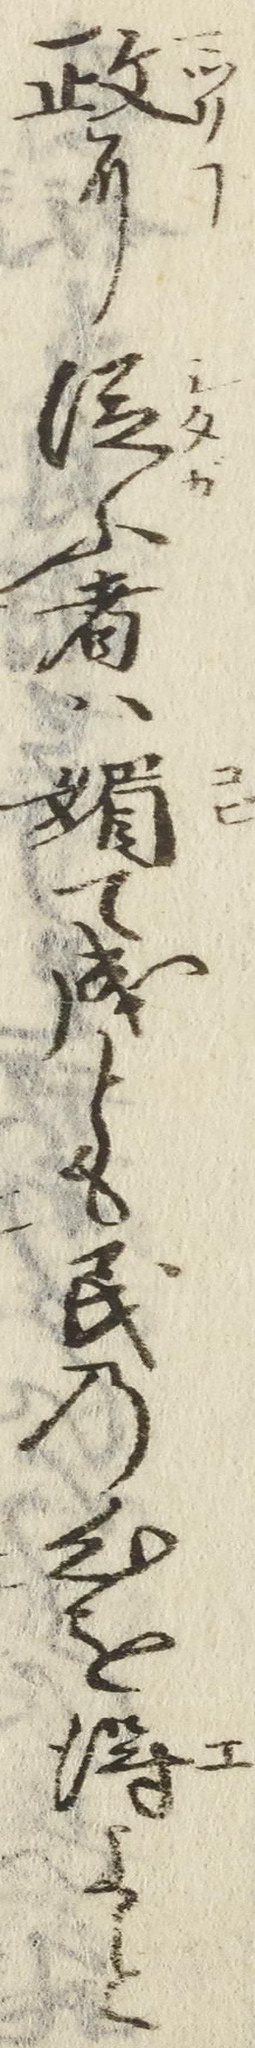政に従ふ者は媚て成とも民の心を得よと
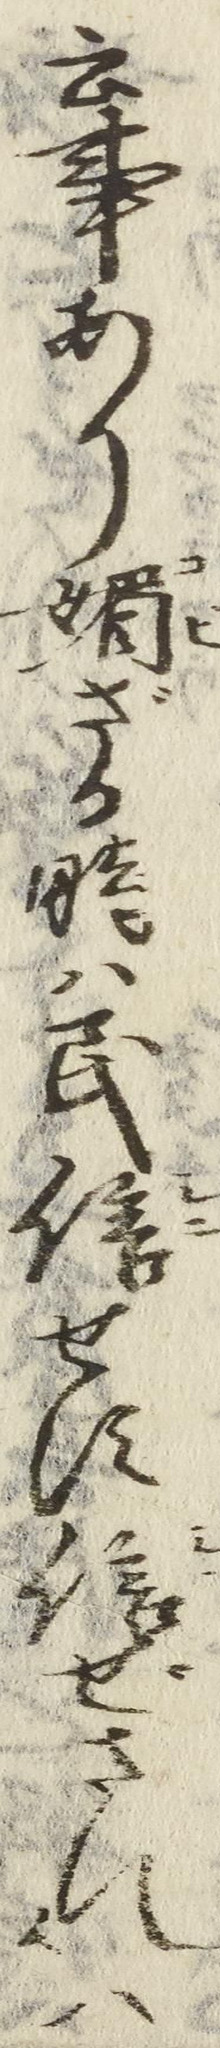云事あり媚ざる時は民信せす信ぜされは
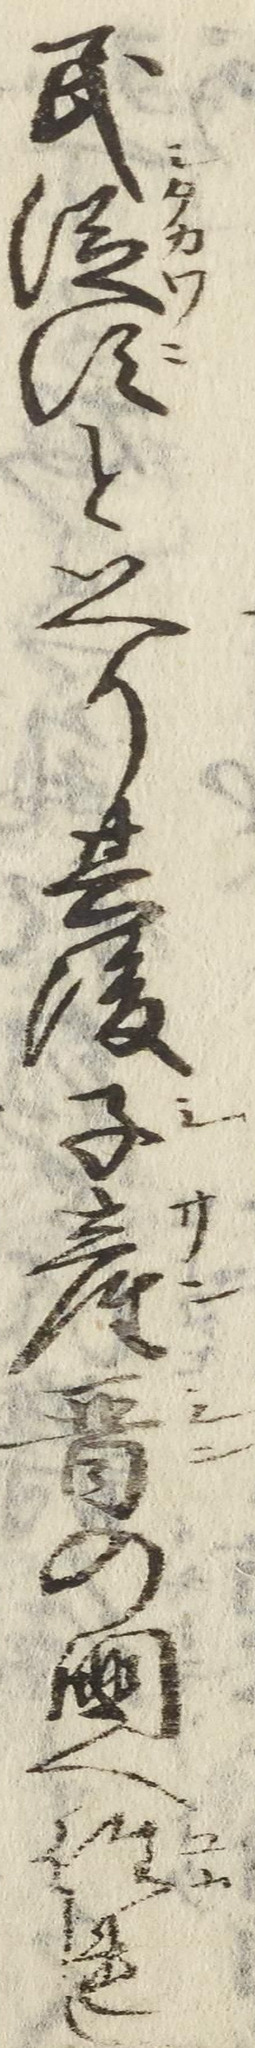民従ずといへり其後子産晋の国へ往れし
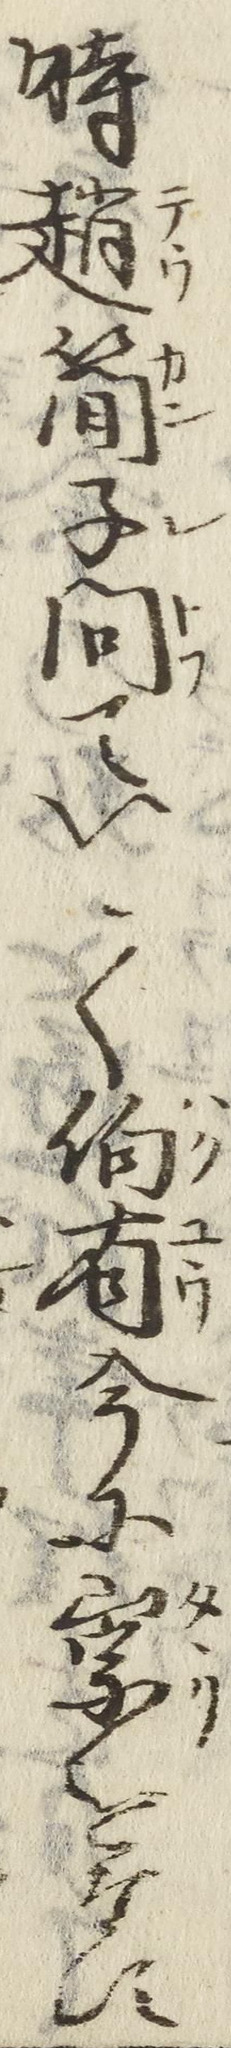時趙簡子問ていわく伯有今に祟をなす
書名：天地或問珍　地
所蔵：東京大学地震研究所図書室 Earthquake Research Institute Library, The University of Tokyo, JAPAN
